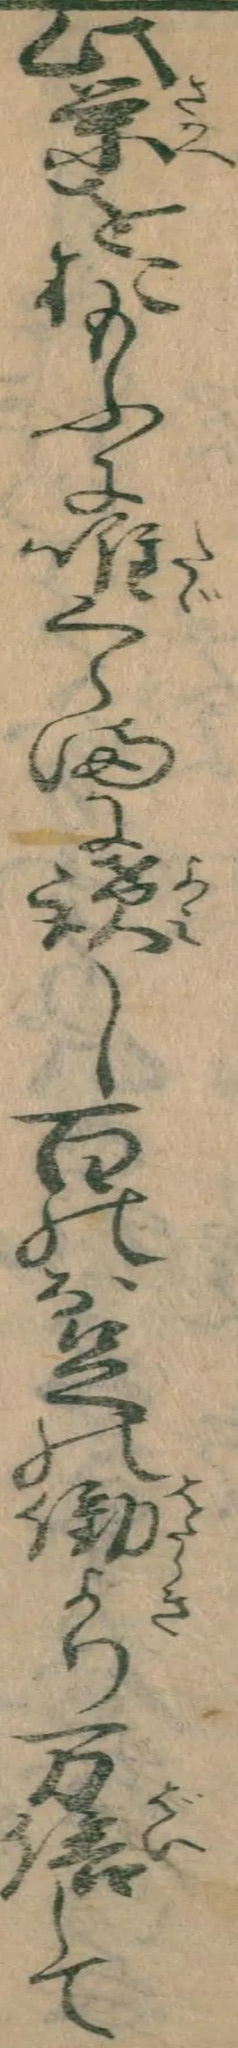此栄をおもふに唯くらまに読し百のお足の働より万倍して
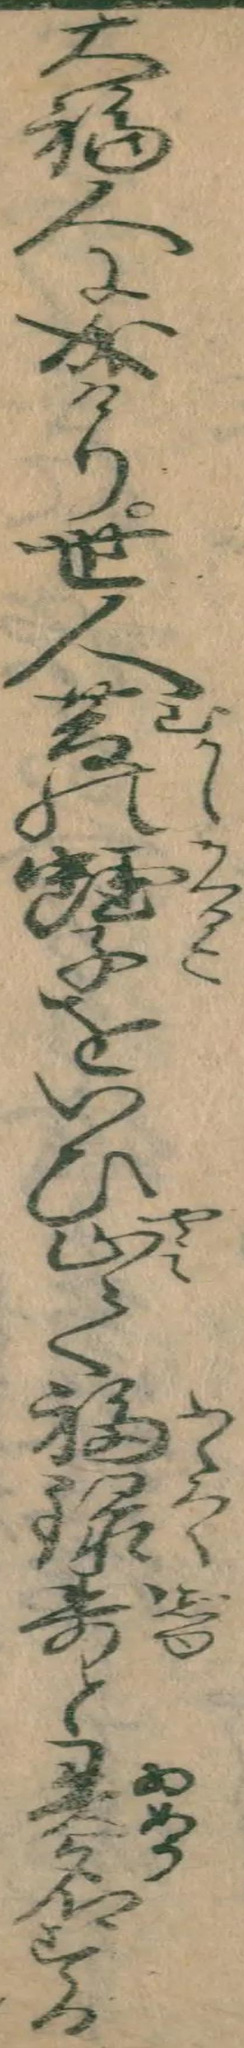大福人に成けり。世人昔の子をいひ止て福録寿と異名する
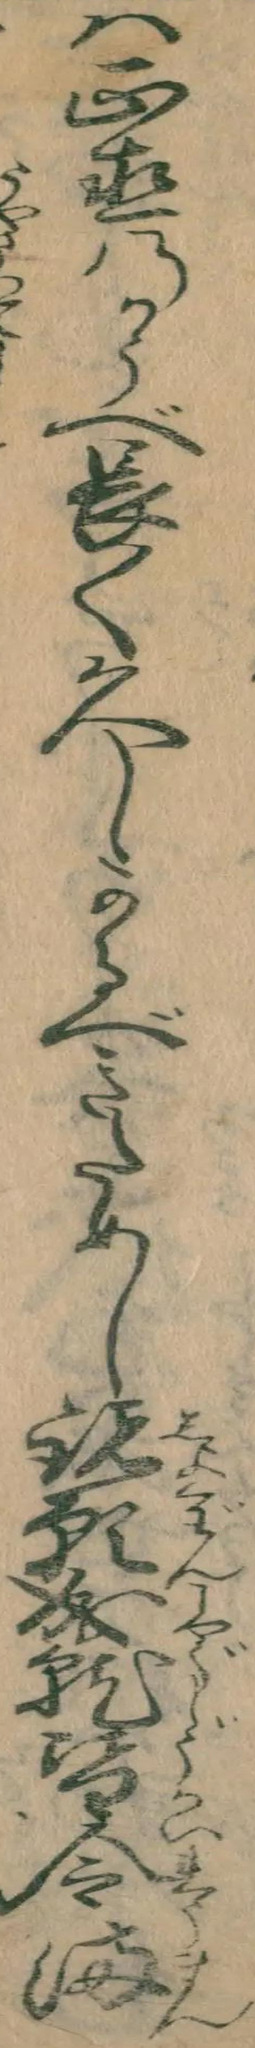は正直のかうべ長〱久しかるべきためし諸願成就皆令満
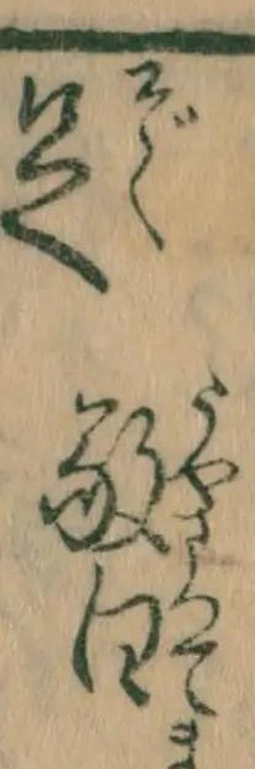足敬白
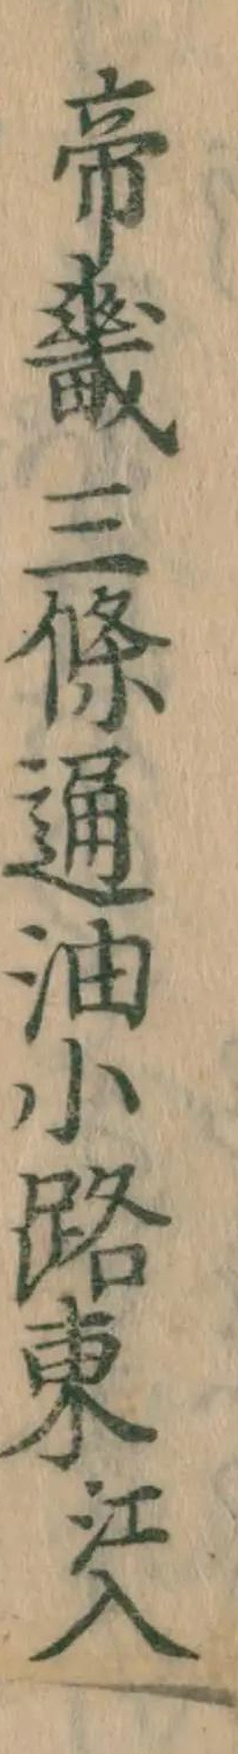帝幾三条通油小路東江入
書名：新竹斎 5巻
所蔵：国立国会図書館 National Diet Library, JAPAN
